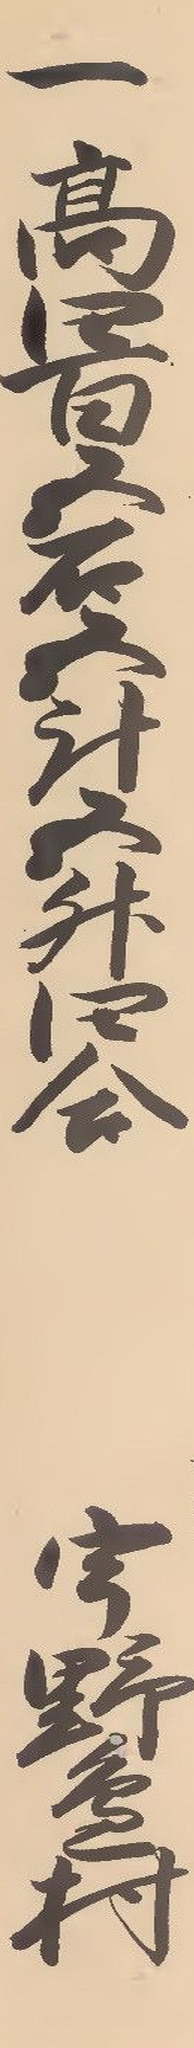一高四百五石五斗五升四合宇野辺村
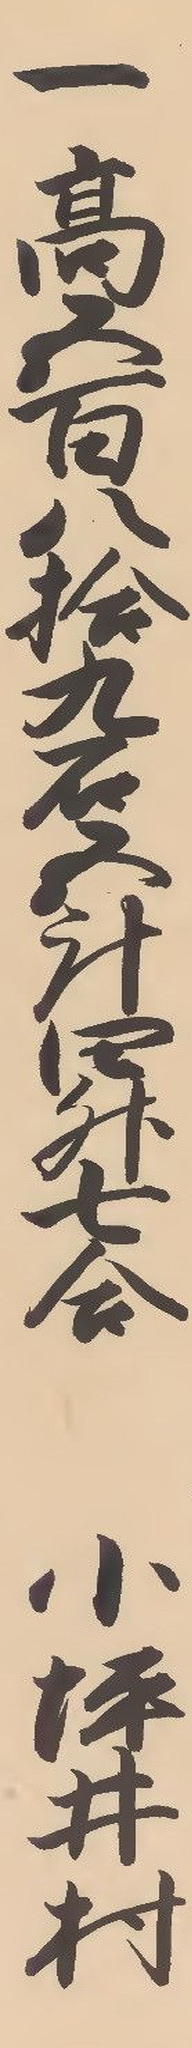一高五百八拾九石五斗四升七合小坪井村
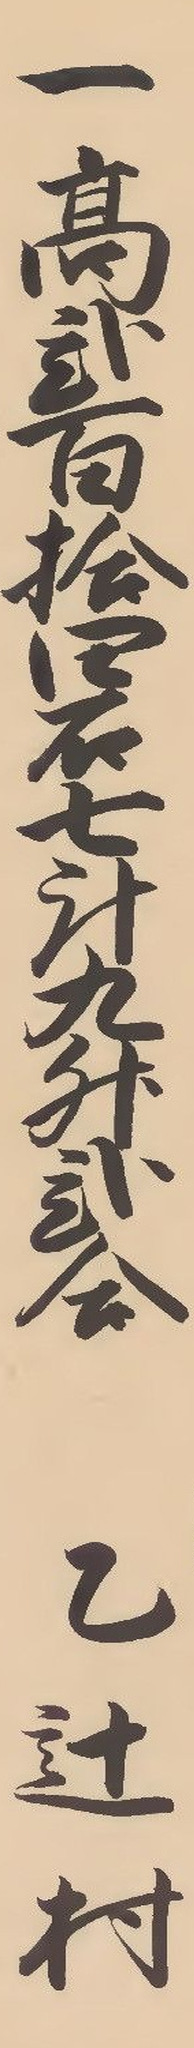一高弐百拾四石七斗九升弐合乙辻村
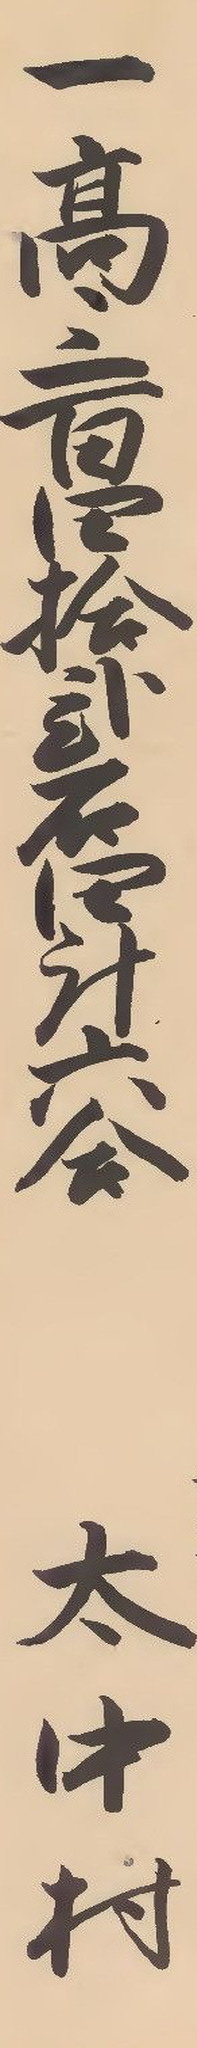一高三百四拾弐石四斗六合太中村

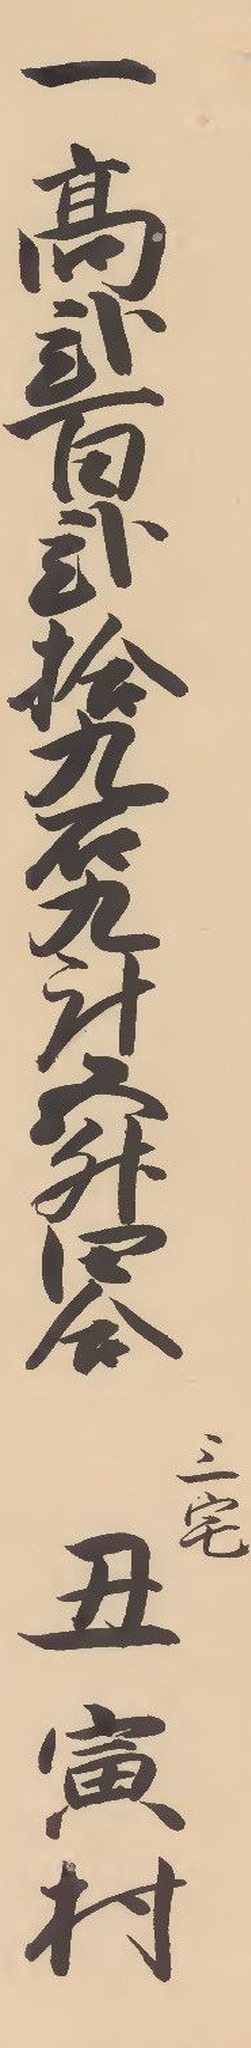一高弐百弐拾九石九斗五升四合丑寅村
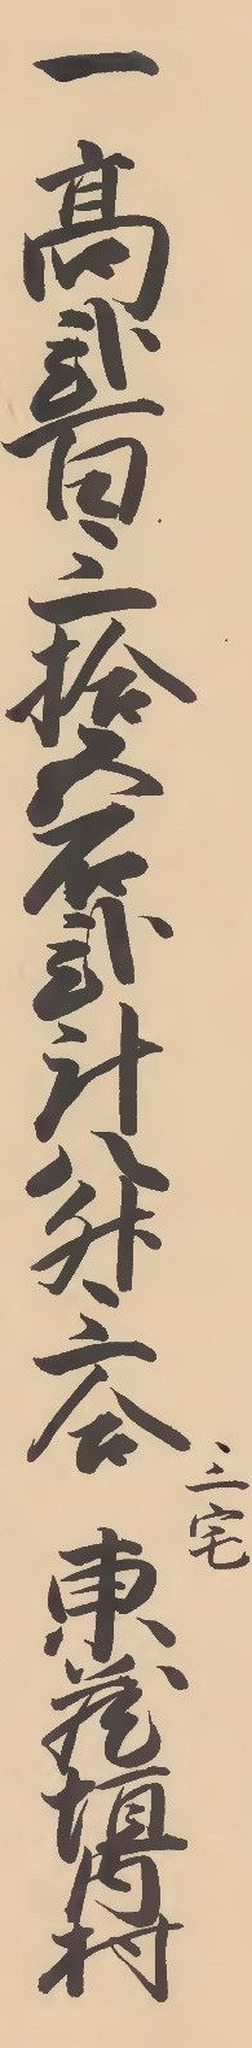一高弐百三拾五石弐斗八升三合東蔵垣内村
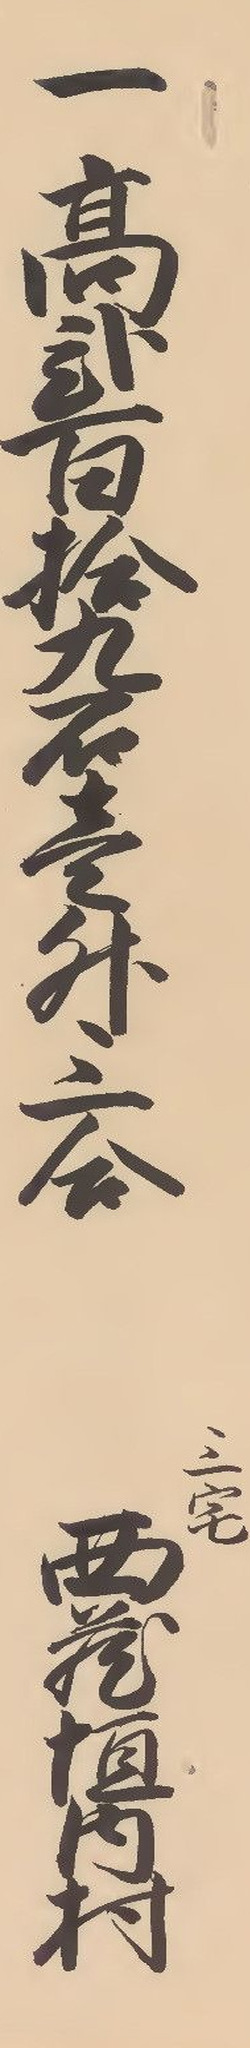一高弐百拾九石壱升三合西蔵垣内村
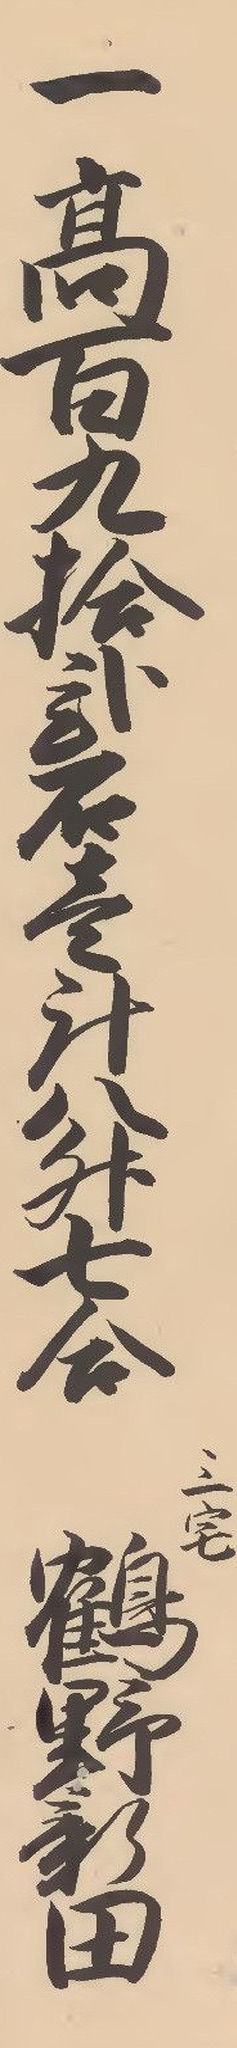一高百九拾弐石壱斗八升七合鶴野新田
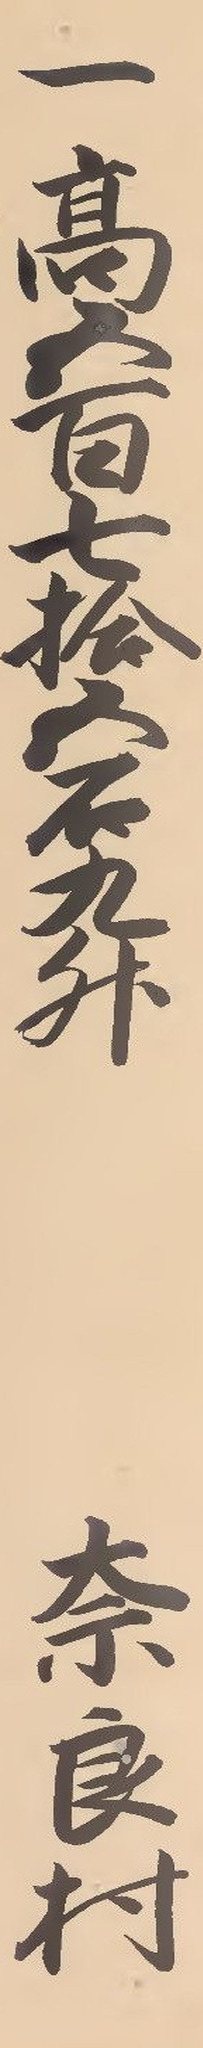一高百七拾五石九升奈良村
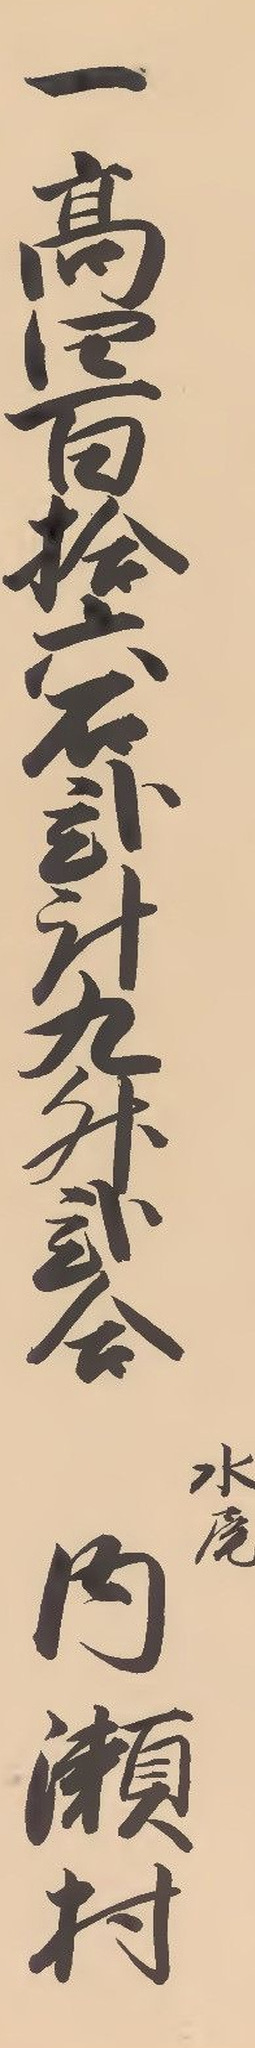一高四百拾六石弐斗九升弐合内瀬村
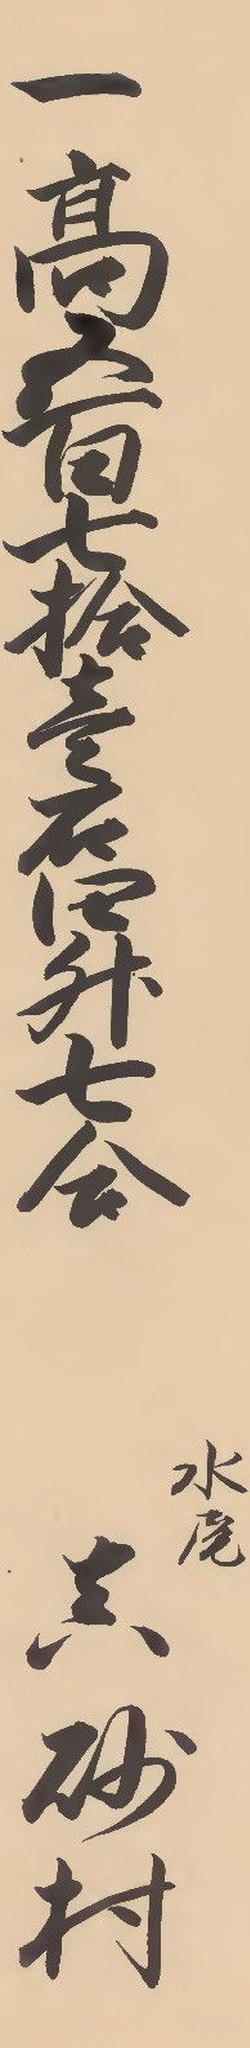一高五百七拾壱石四升七合真砂村
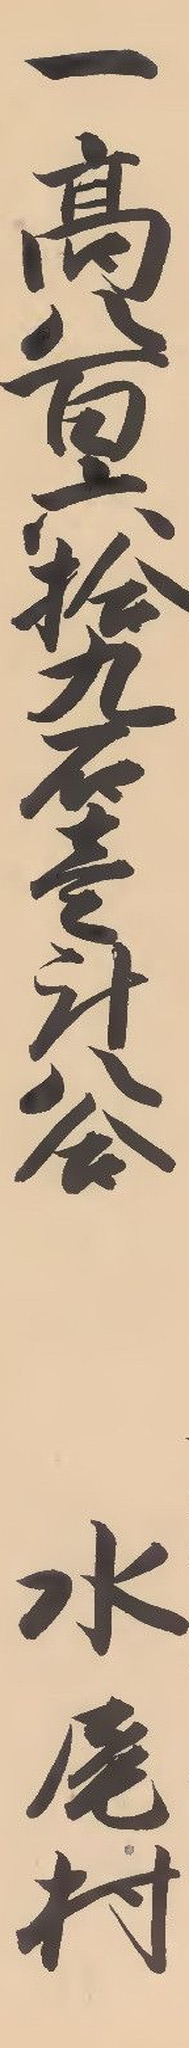一高八百六捨九石壱斗八合水尾村

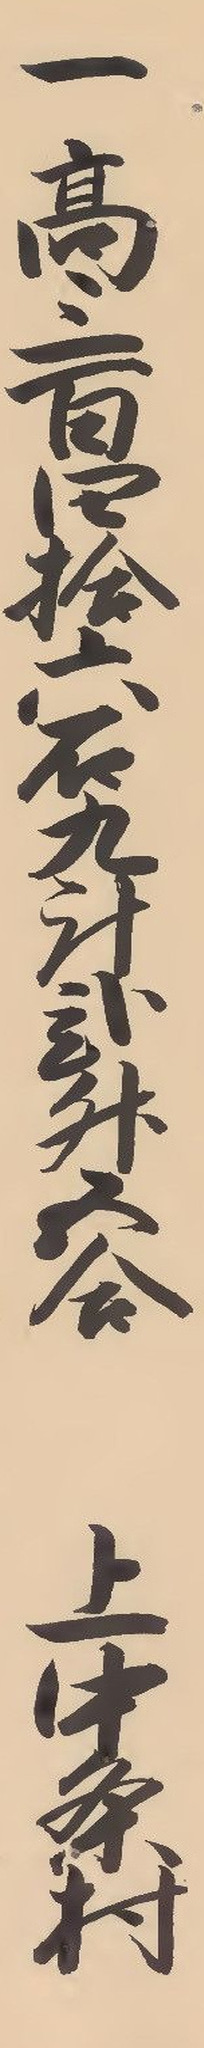一高三百四拾六石九斗弐升五合上中条村
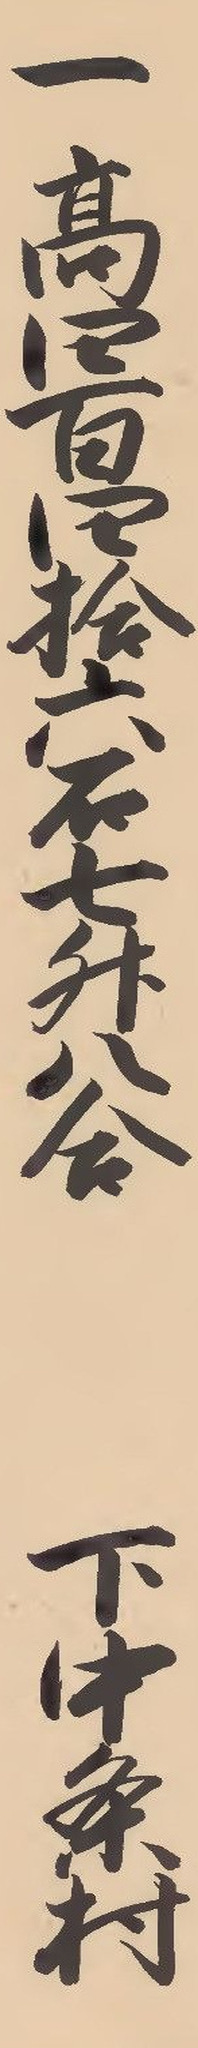一高四百四拾六石七升八合下中条村
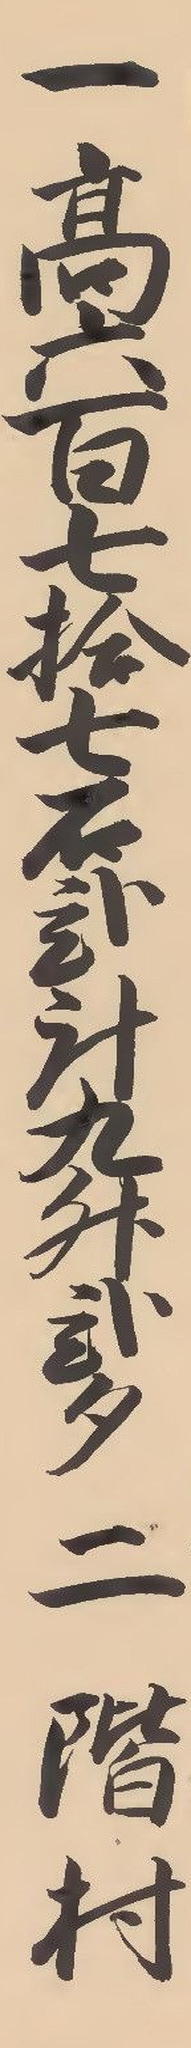一高六百七拾七石弐斗九升弐勺二階村
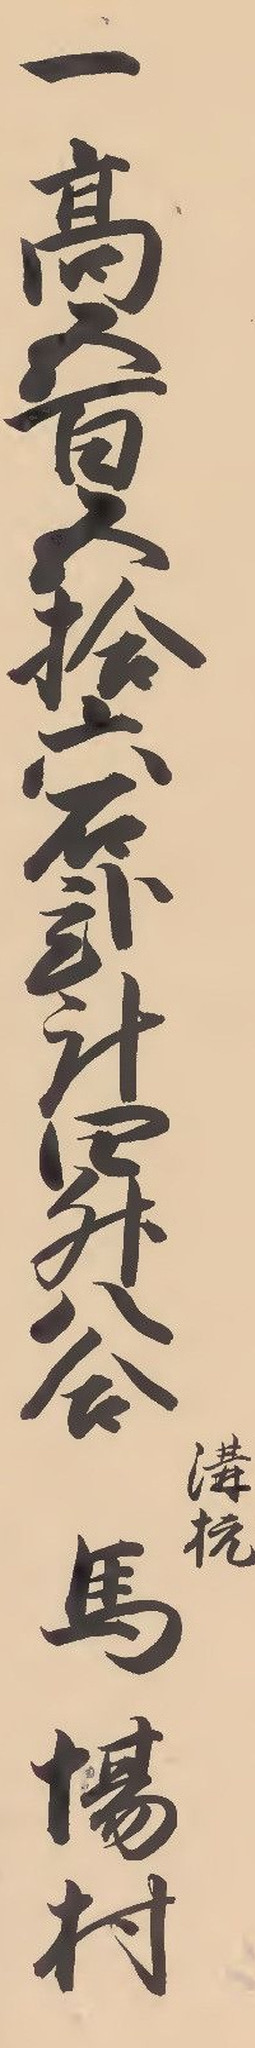一高五百五拾六石弐斗四升八合馬場村
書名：摂津国郷帳
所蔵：国立公文書館 National Archives of Japan
